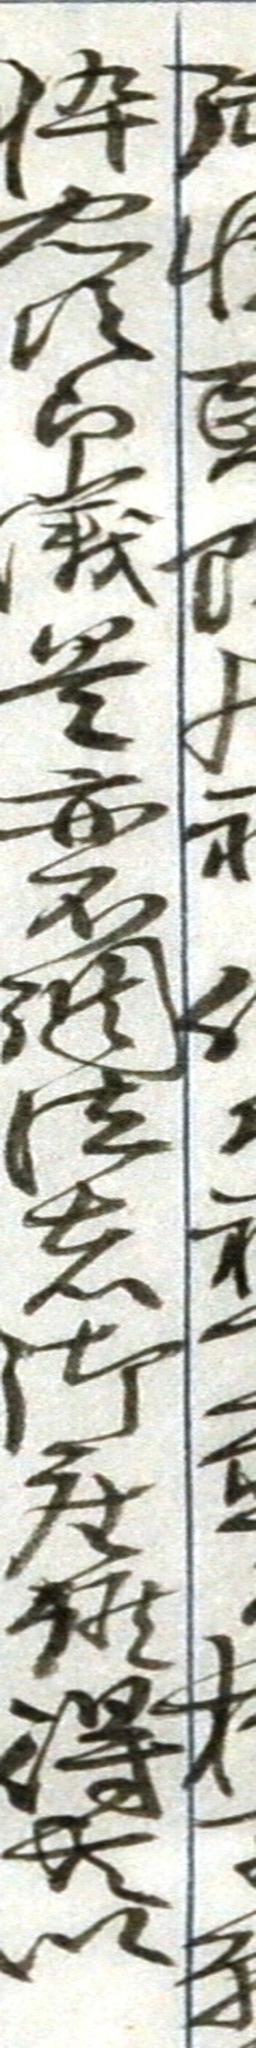忰忠次郎儀是亦不調法者御座候得共以
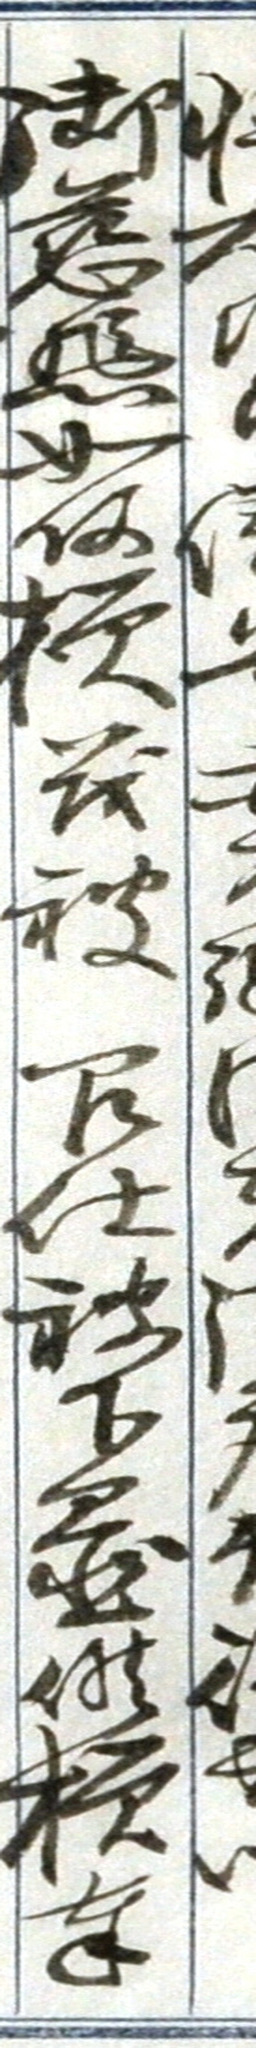御慈悲如何様茂被召仕被下置候様奉
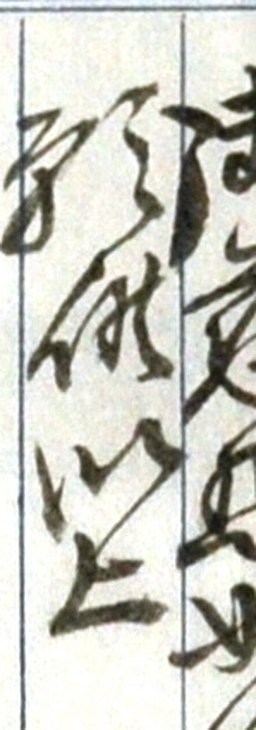願候以上
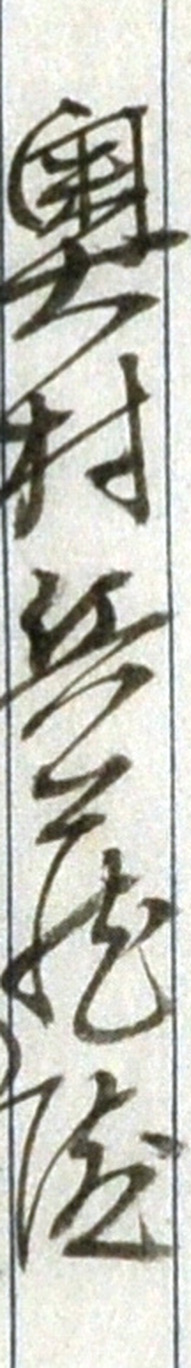奥村兵蔵殿
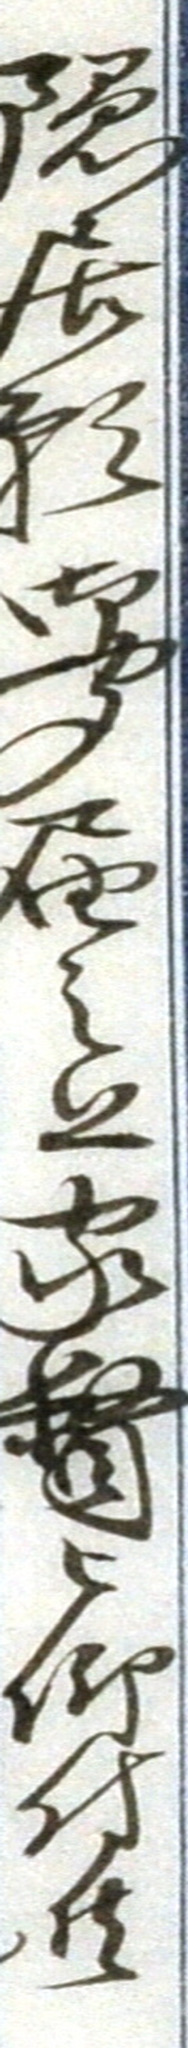隠居願御聞届之上家督被仰付共
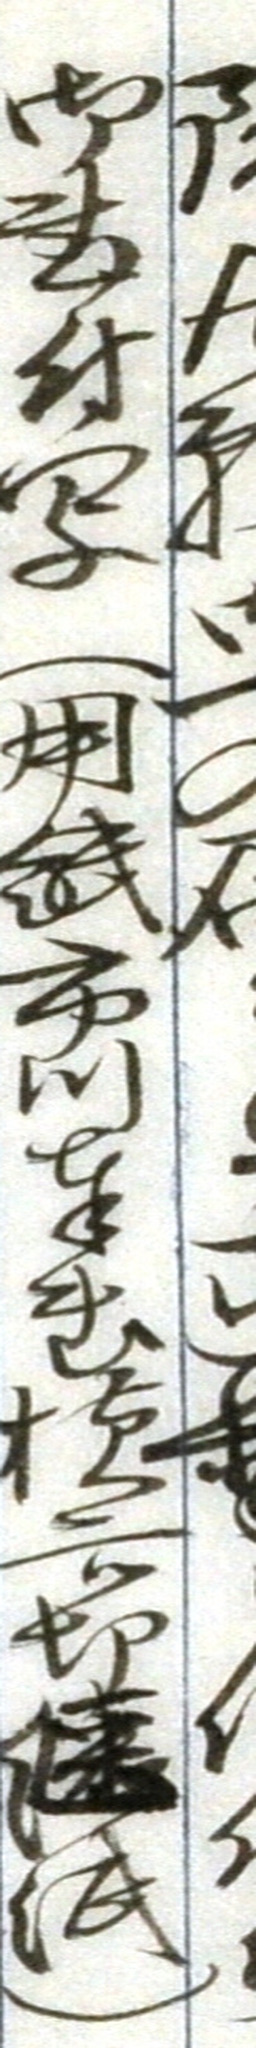御書付写用紙市川奉書様二ツ切継紙
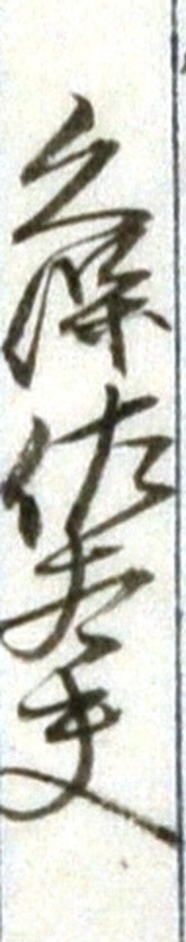久保佐太夫
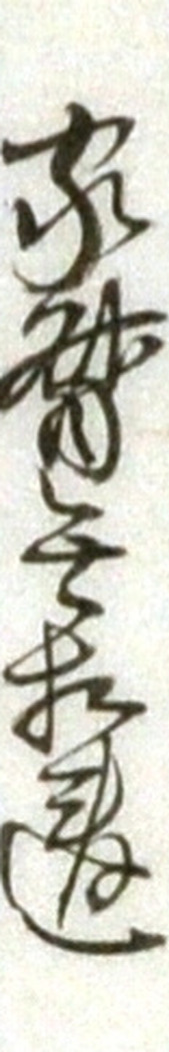家督無相違
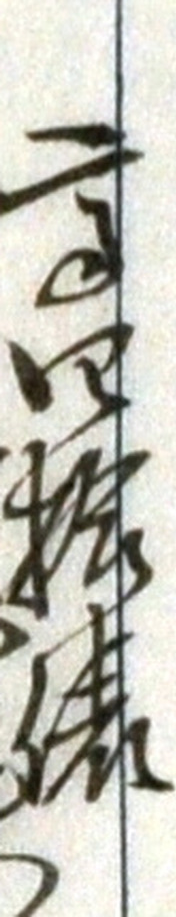高四拾俵
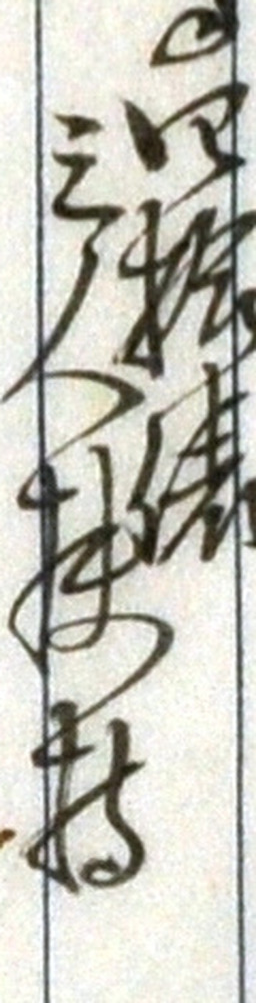三人扶持
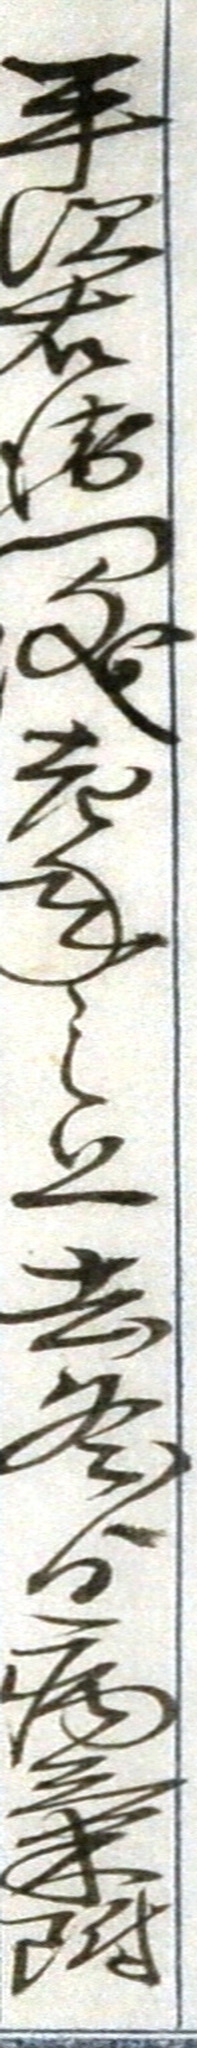平治右衛門儀老年之上去冬ゟ病気附
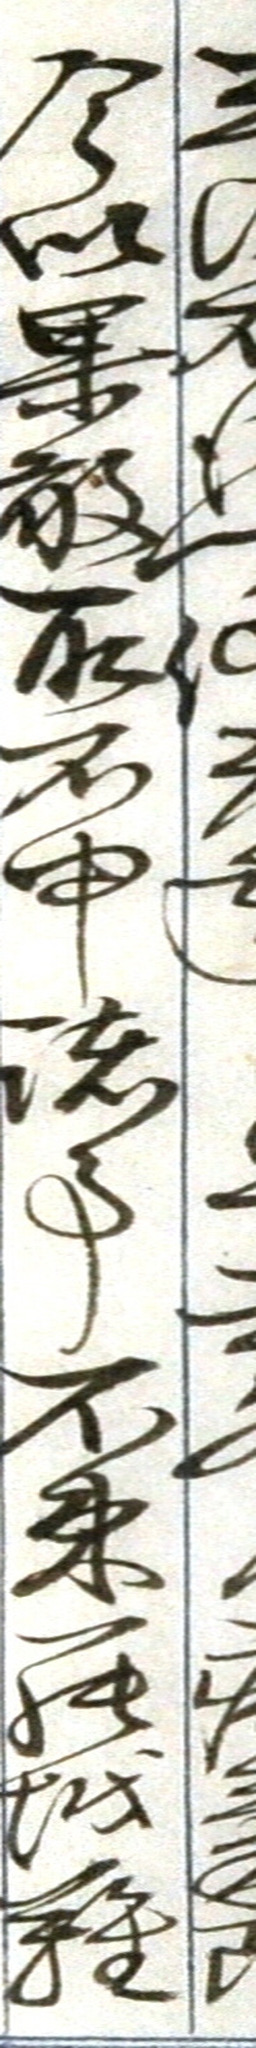今以果敢取不申諸事不束罷越難

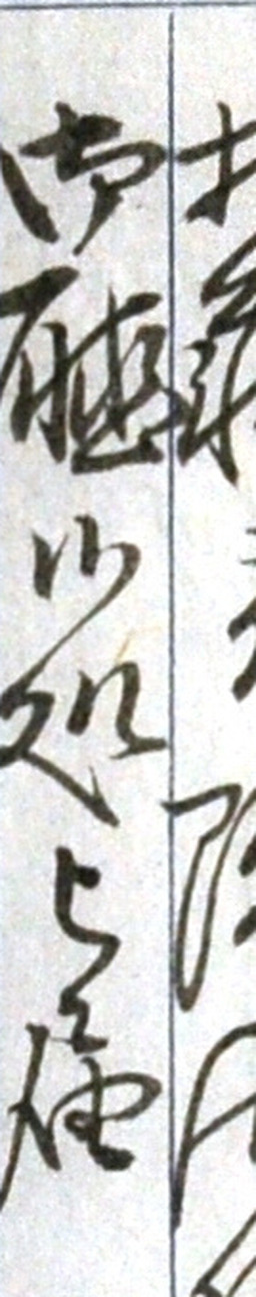御聴候処被届
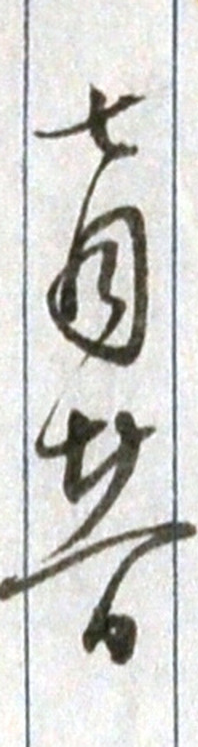七月廿一日
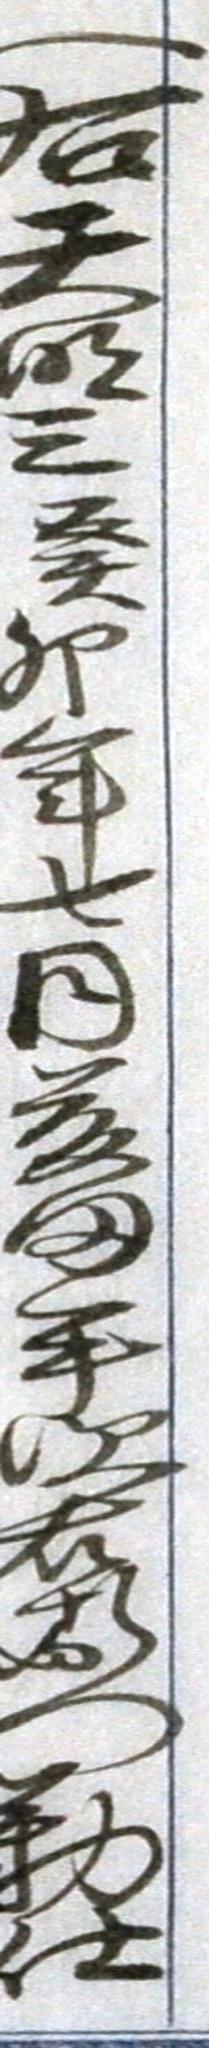右天明三癸卯年七月藤田平治右衛門勤仕
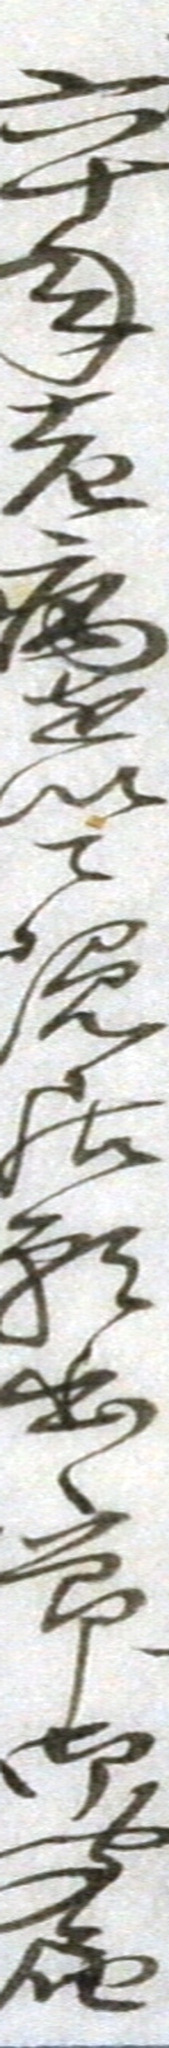六十年老病を以て隠居願出候節御聞届
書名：隠居之願并隠居御聞届嗣子家督被仰付候御書付
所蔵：伊那市立高遠町図書館・合同会社AMANE
